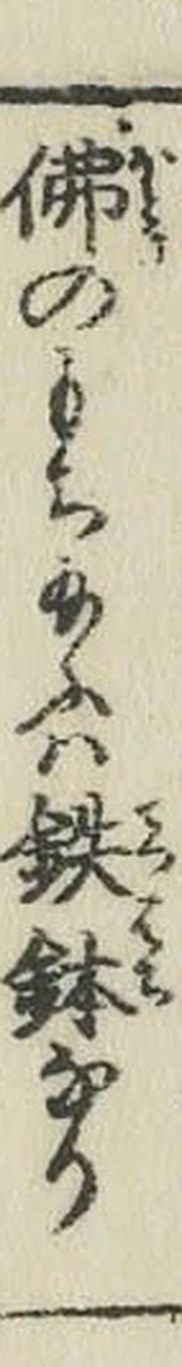仏のもち給ふは鉄鉢なり
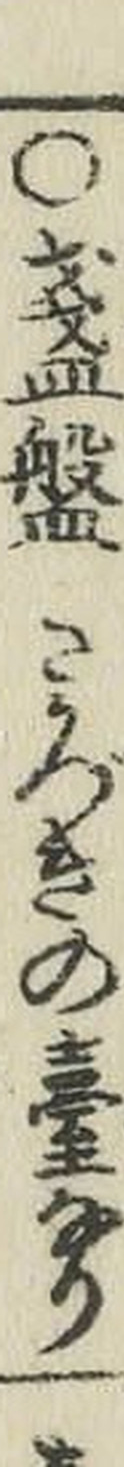○盞盤さかづきの台なり
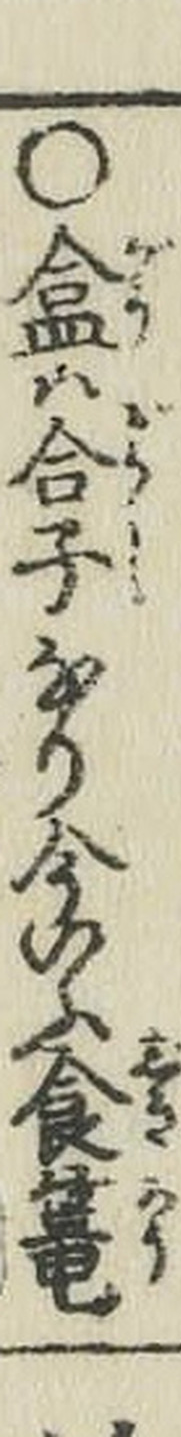○盒は合子なり今いふ食篭
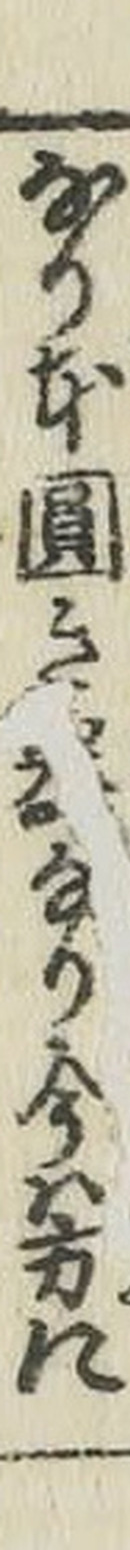なり本円き器なり今は方に
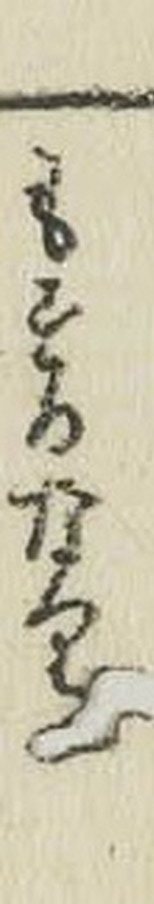もするなり
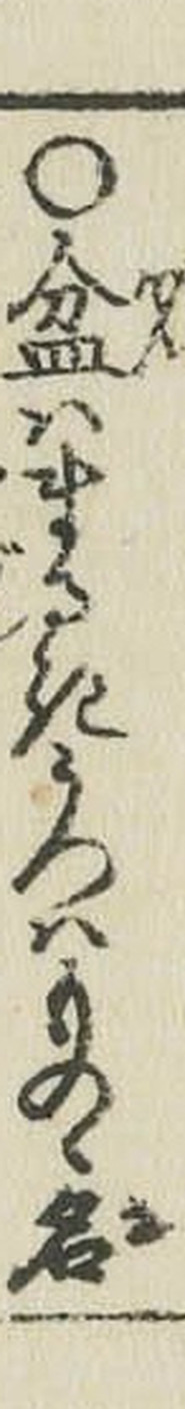○盆はまるきうつはものゝ名
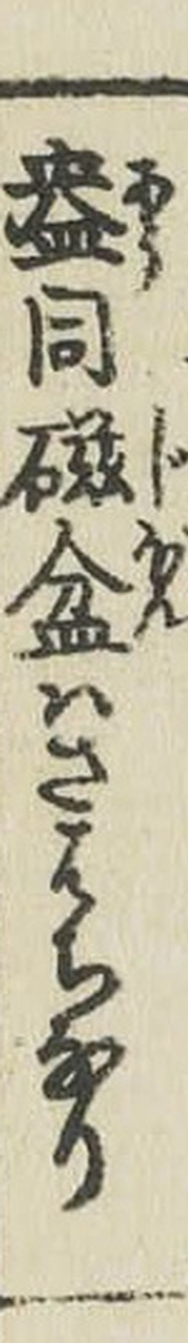盎同磁盆はさはちなり
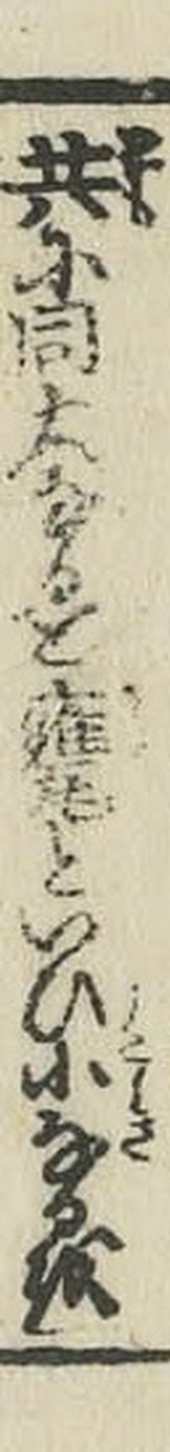共に同大なるを甕といひ小なるを
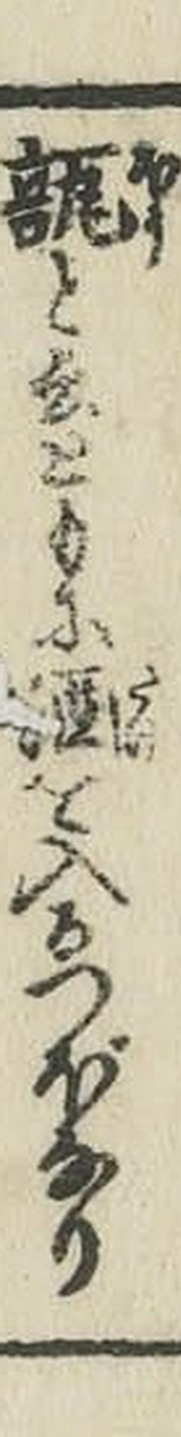瓿と云ともに酒を入るつぼなり
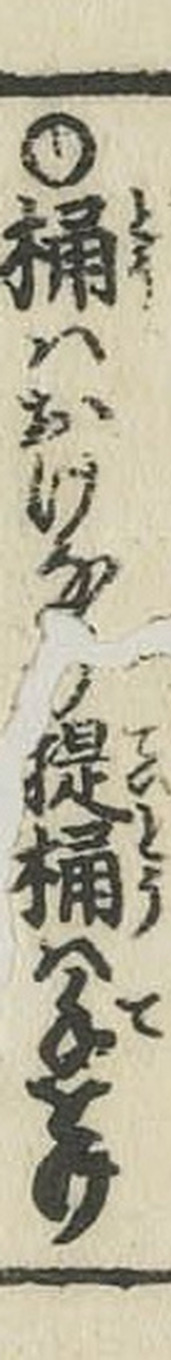○桶はおけなり提桶は手をけ
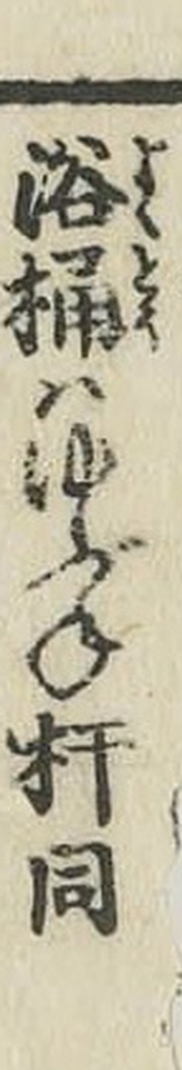浴桶はゆぶね杆同
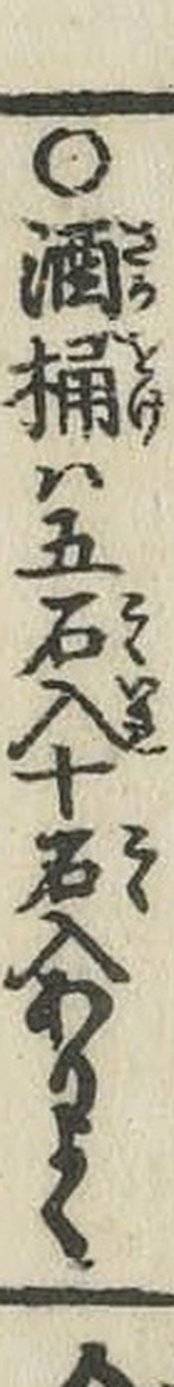○酒桶は五石入十石入ありよく
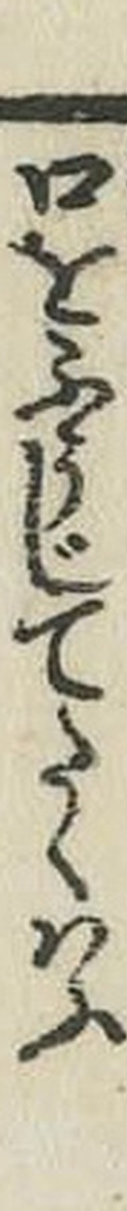口をふうじてたくはう
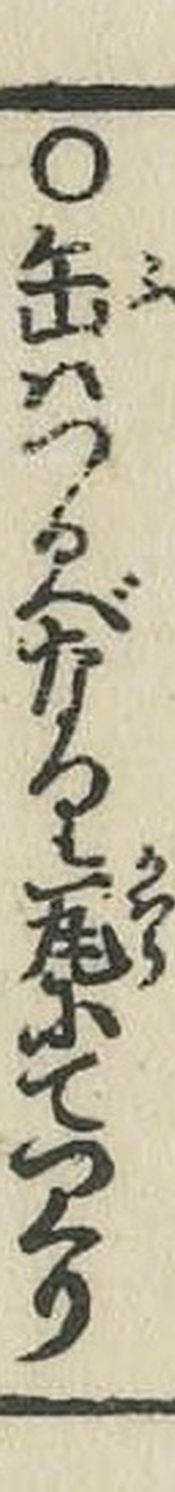○缶はつるべなり瓦にてつくり
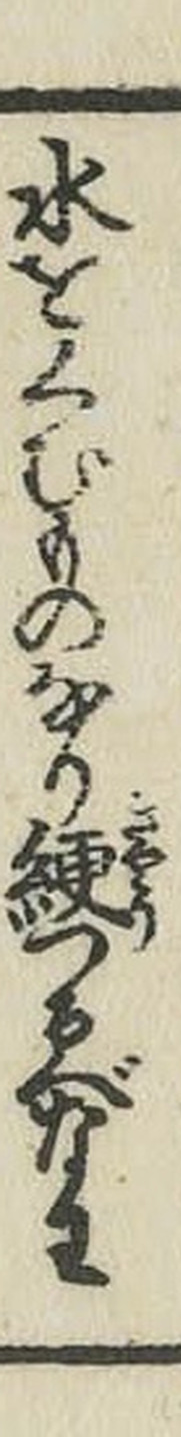水をくむものなり綆つるべなわ
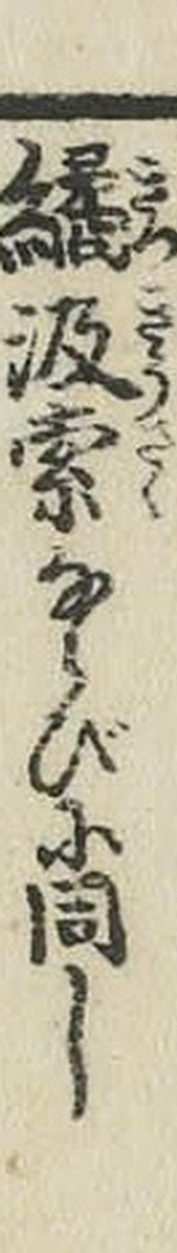繘汲索ならびに同し
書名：増補頭書訓蒙図彙大成 10巻 5:巻之9-11
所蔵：東京学芸大学教育コンテンツアーカイブ
